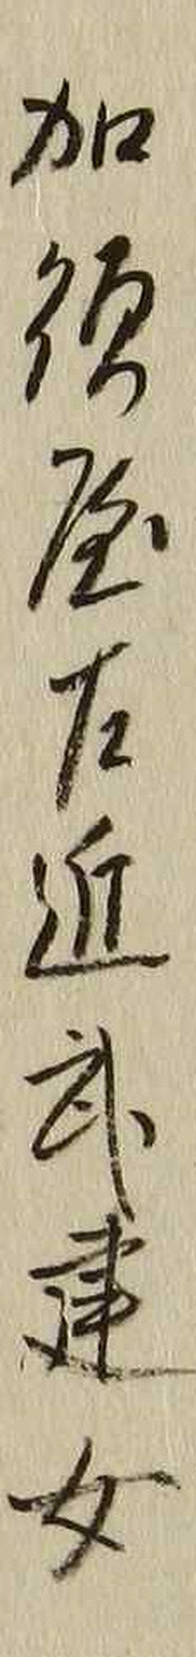加須屋左近武建女
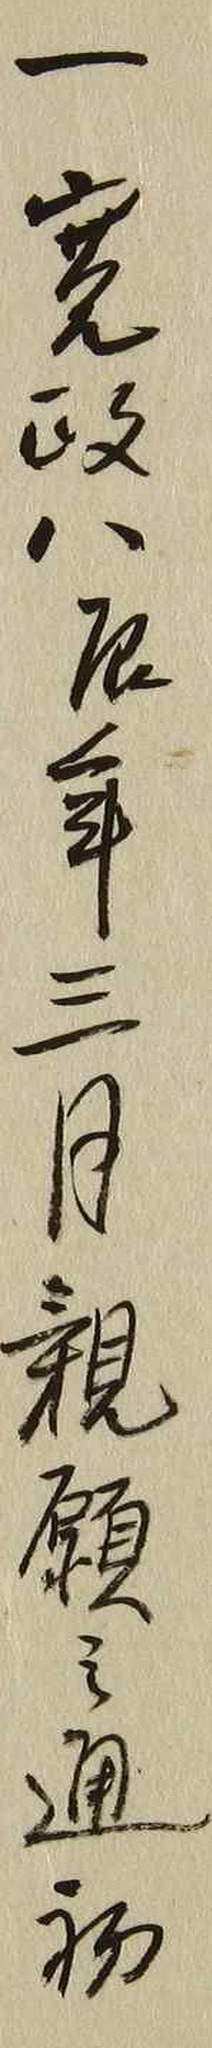一寛政八辰年三月親願之通初
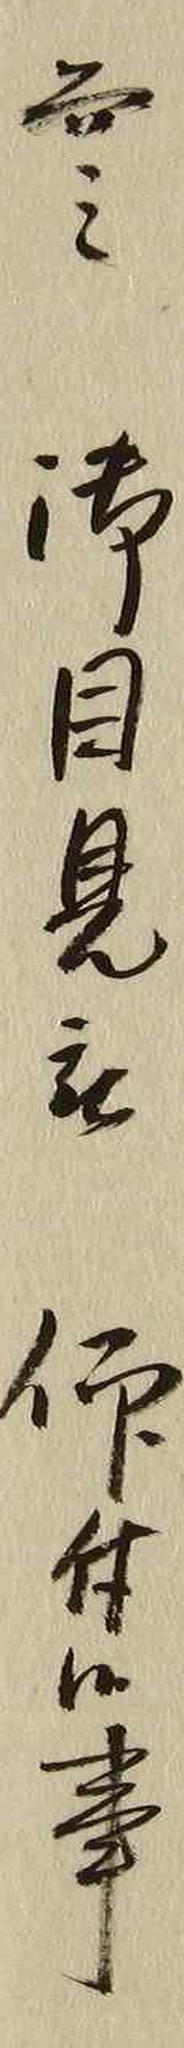而之御目見被仰付候事
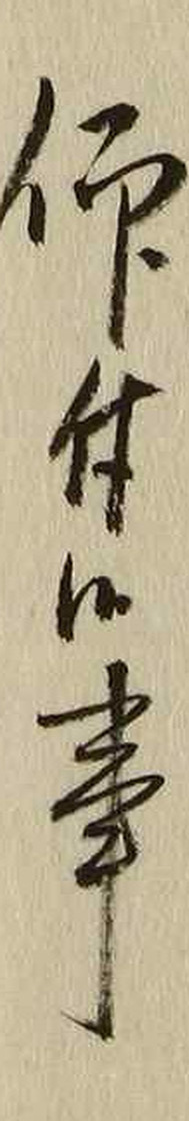仰出候事
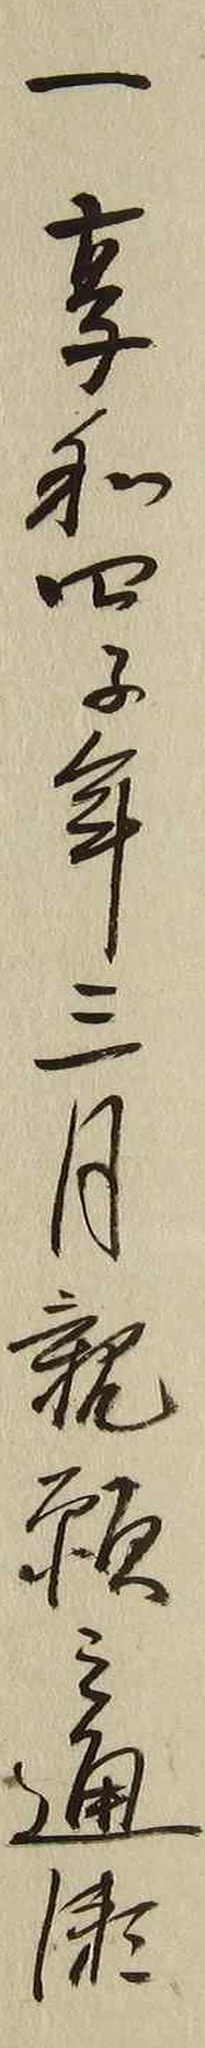一享和四子年三月親願之通瀬
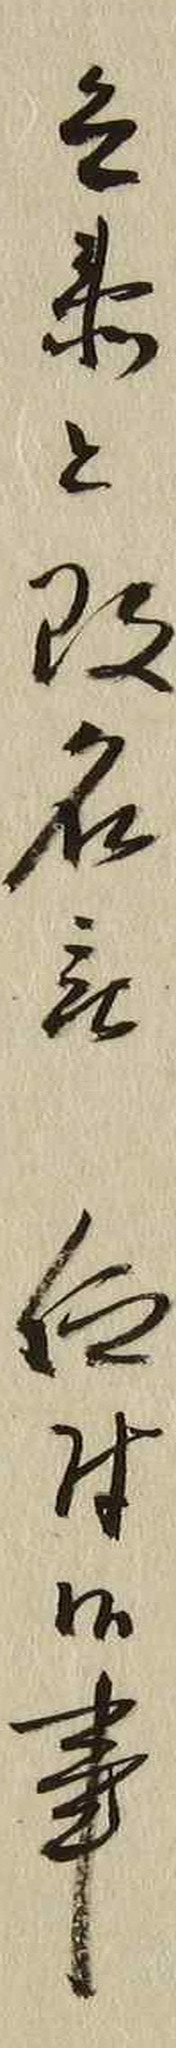兵衛と改名被仰付候事
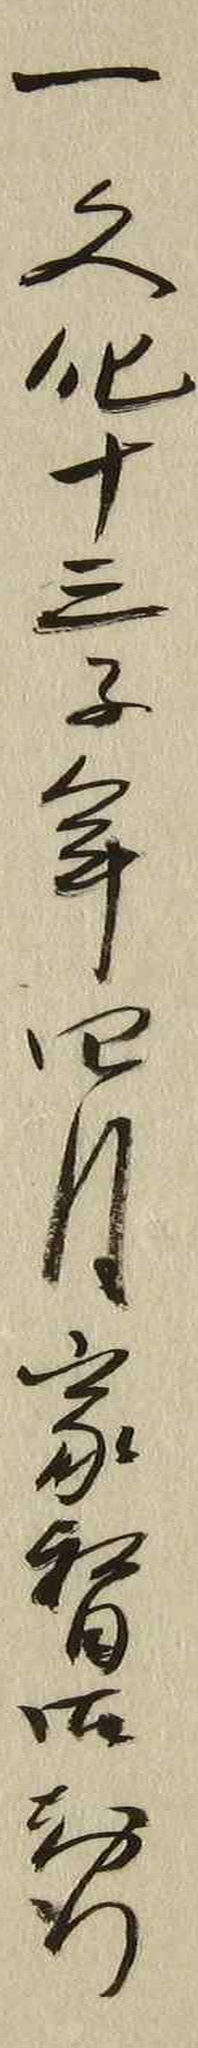一文化十三子年四月家督御知行
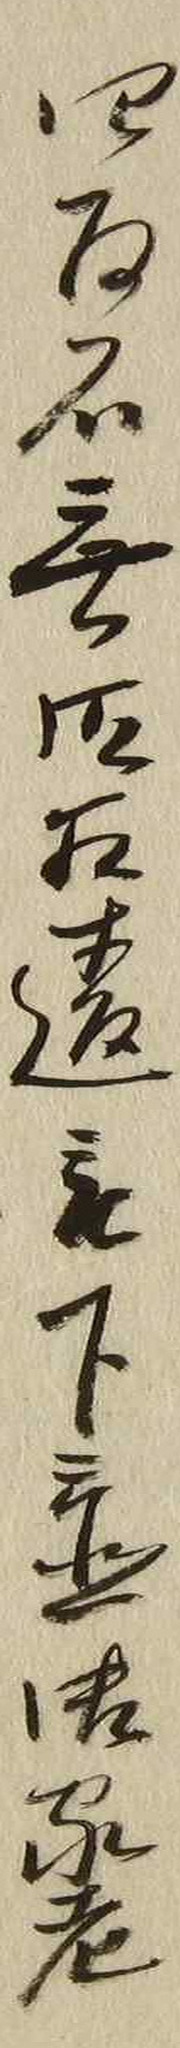四百石無御相違被下置御家老
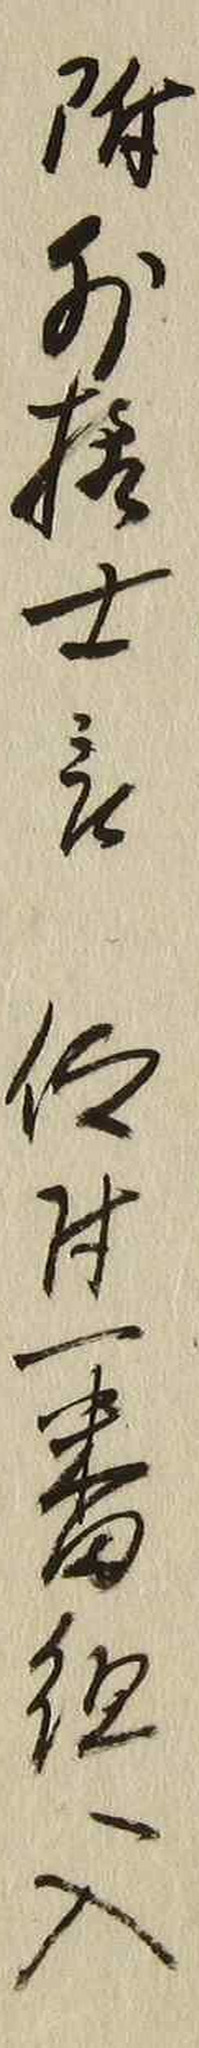附外様士被仰付一番組へ入
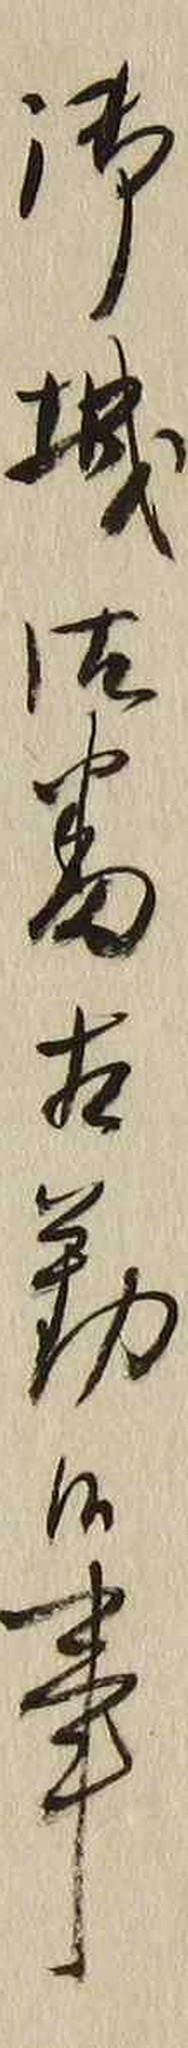御城御番相勤候事
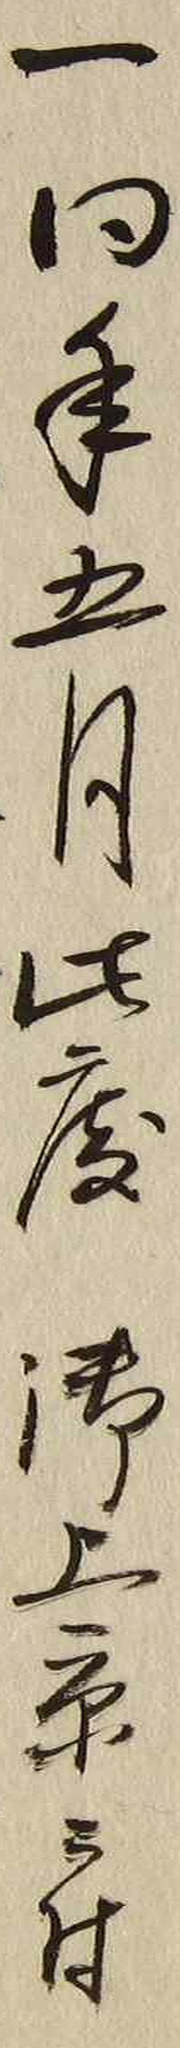一同年五月此度御上京ニ付
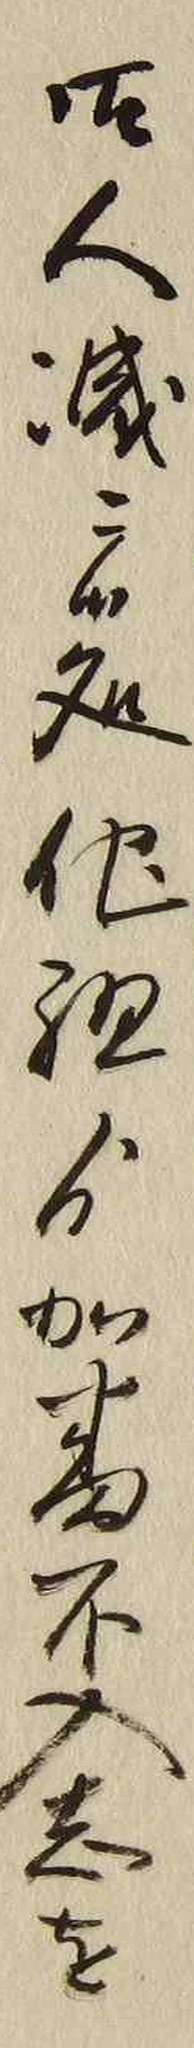御人減ニ候処他組ゟ加番不入志を
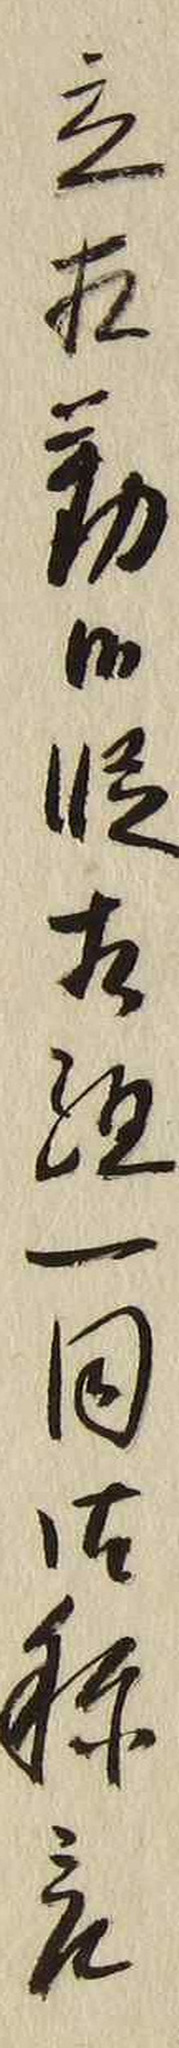立相勤候段相組一同御称被
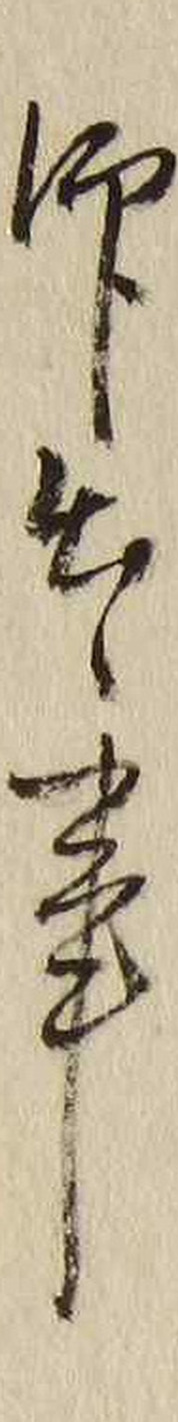仰出候事

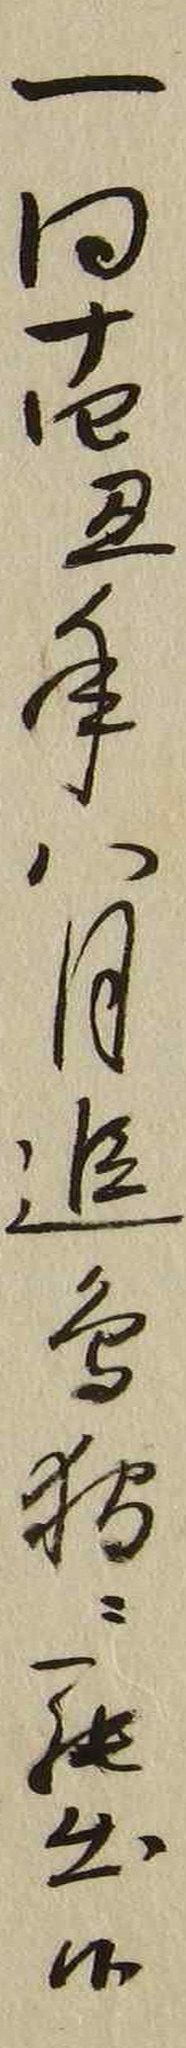一同十四丑年八月追鳥狩ニ罷出候
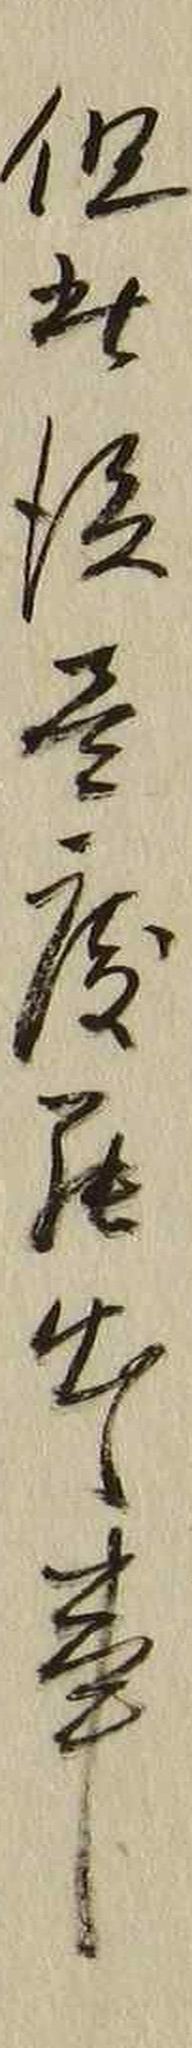但此後壱度罷出候事
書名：諸士系譜　巻之356　す之部6
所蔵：会津若松市立会津図書館
